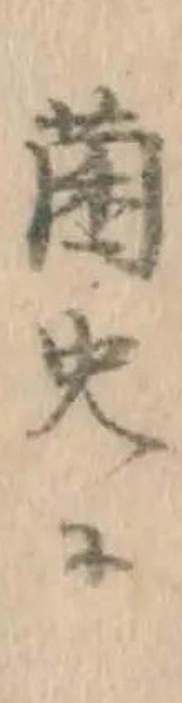菌史に
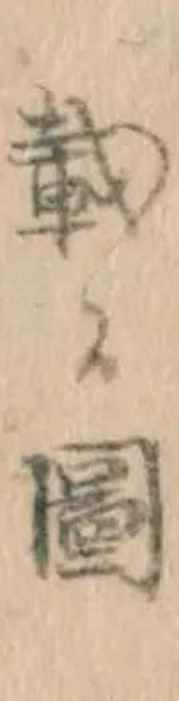載る図
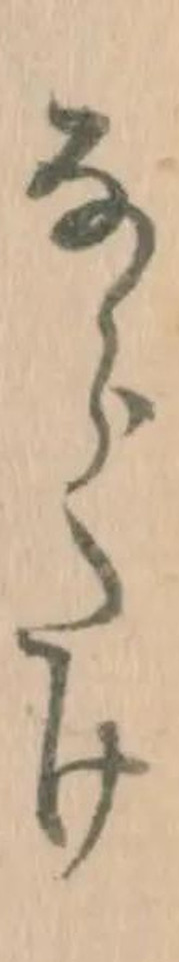ならたけ
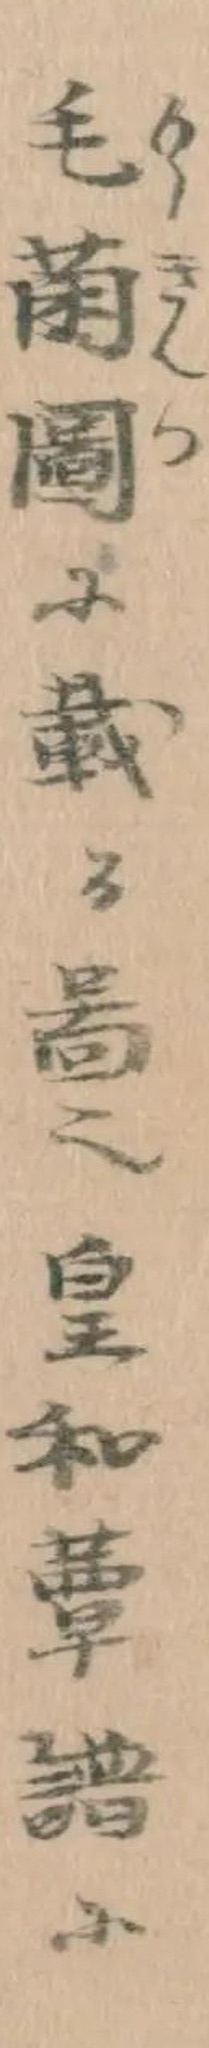毛菌図に載る図也皇和蕈譜に
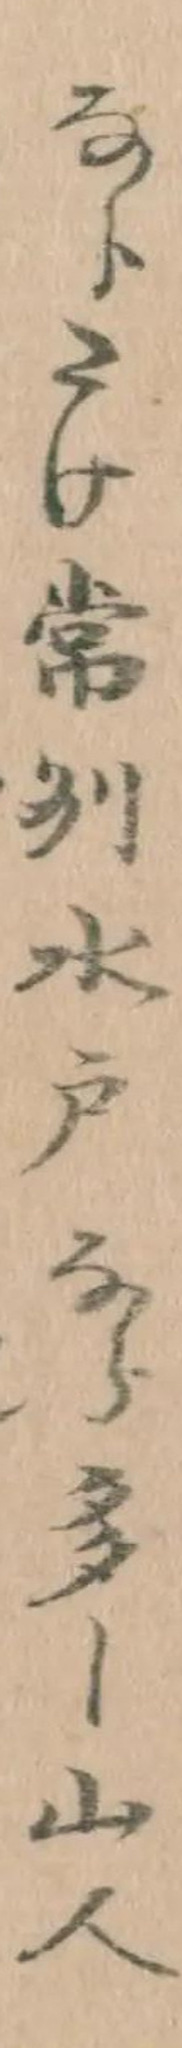ならたけ常州水戸なら多し山人
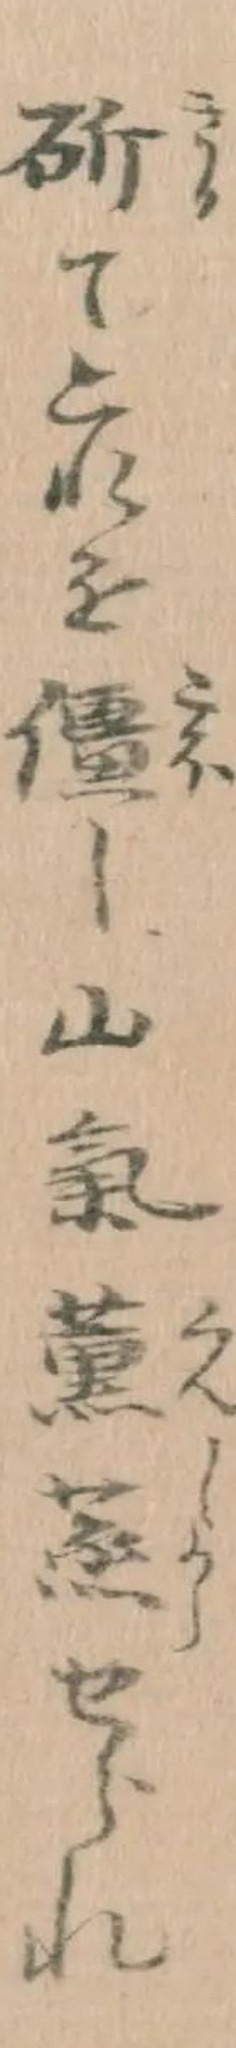斫てこれを僵し山気薫蒸せられ
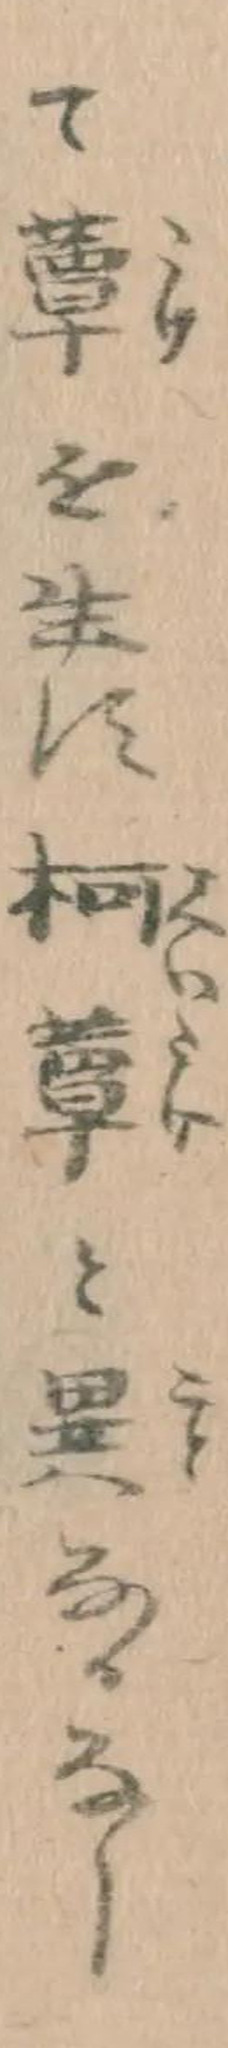て蕈を生す柯蕈と異なるなし
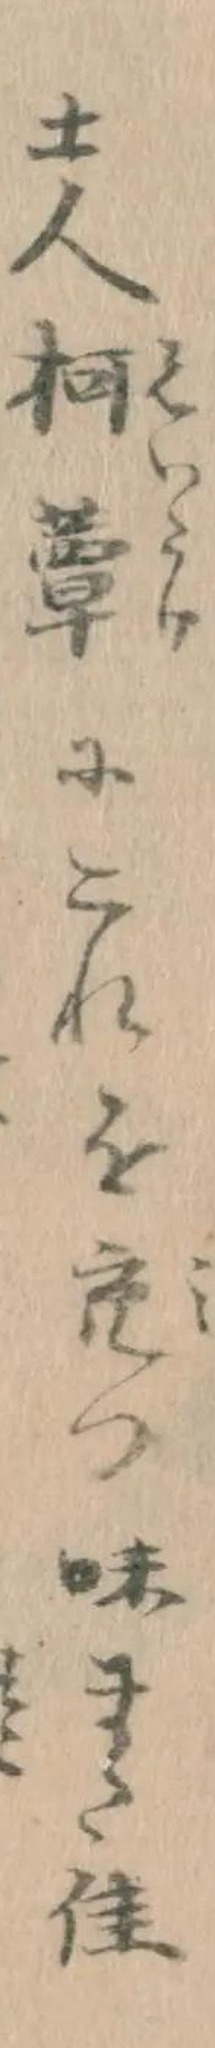土人柯蕈にこれを充つ味また佳
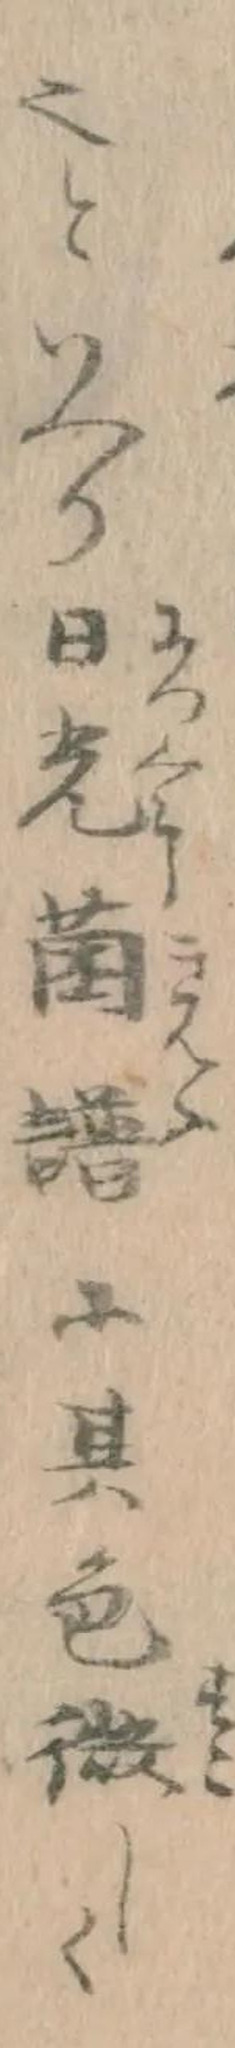也といへり日光菌譜に其色微しく
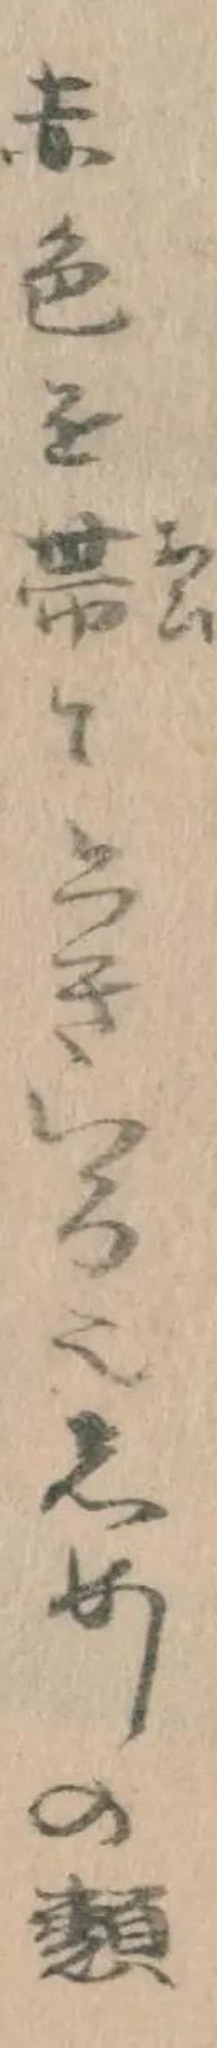赤色を帯てときいろ也しめしの類
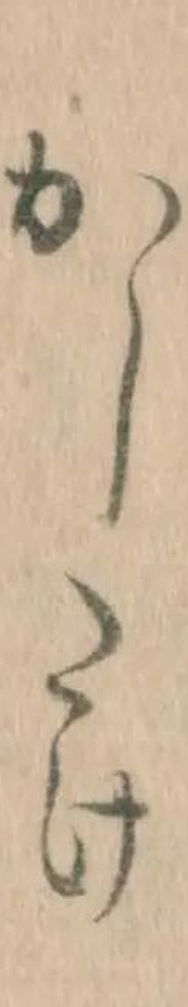かしたけ
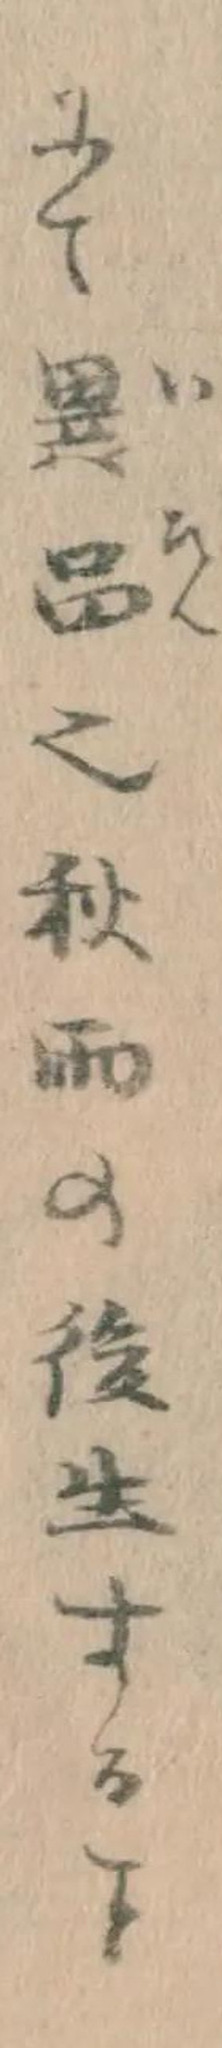にて異品也秋雨の後生すること
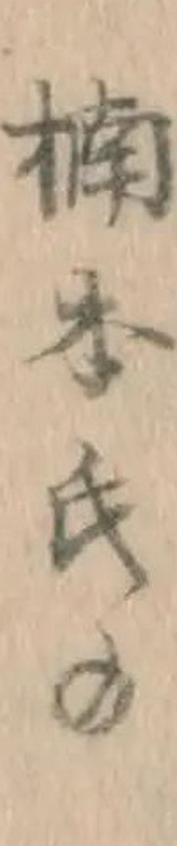楠本氏の
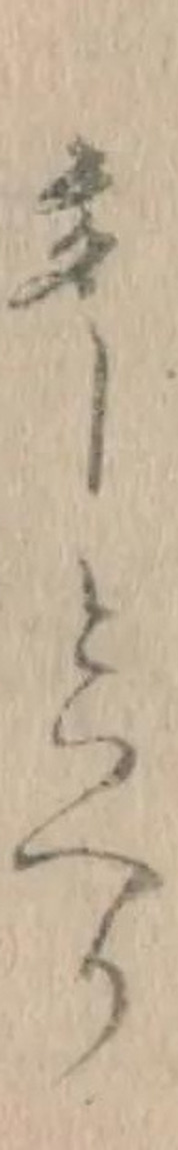多しといへり
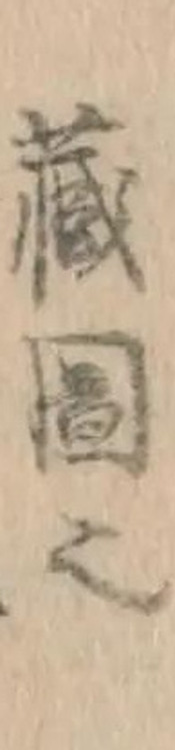蔵図也
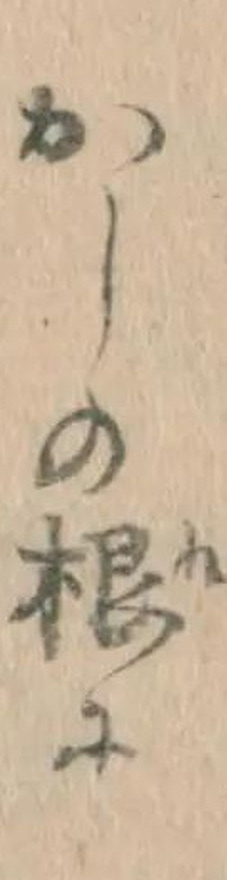かしの根に
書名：本草図譜. 巻55-57
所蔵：国立国会図書館 National Diet Library, JAPAN
